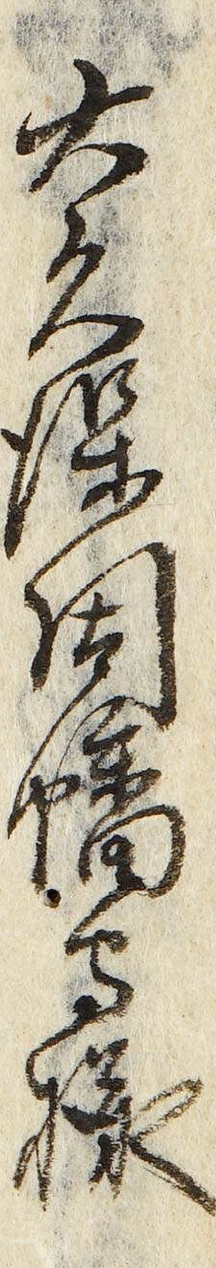大久保因幡守様
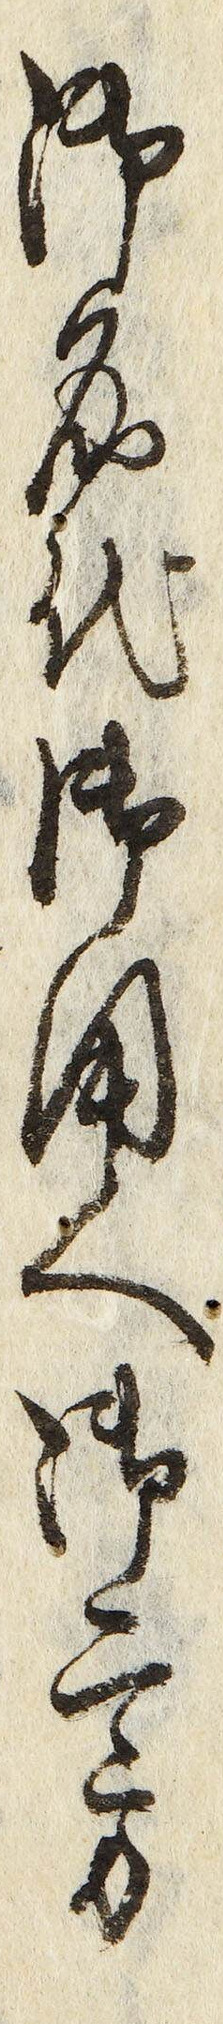御名代御用人御ニ方
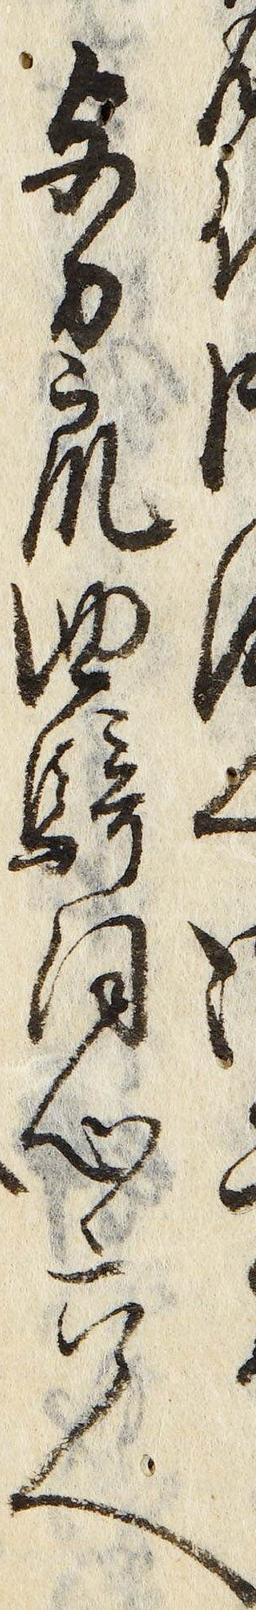与力衆四騎同心六人
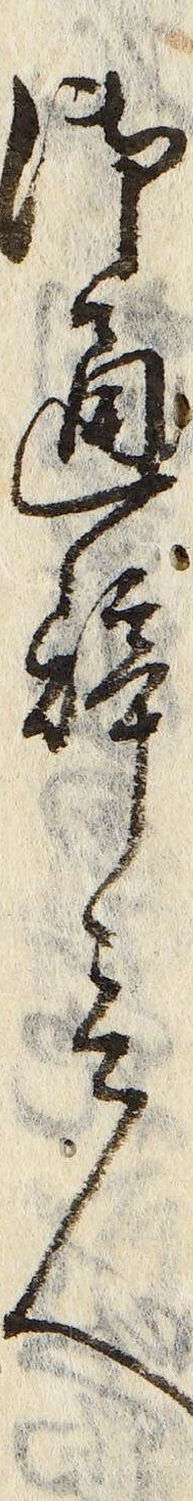御通辞壱人
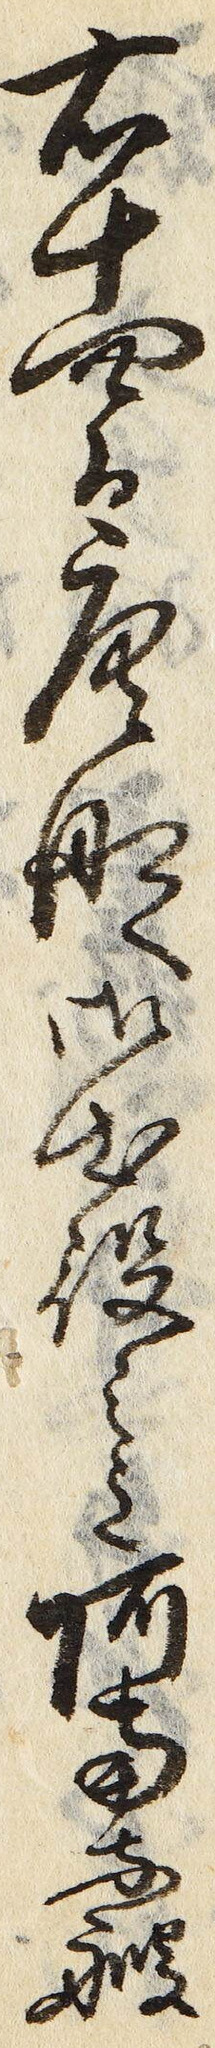右十四日唐船へ御出役之上阿南両艘
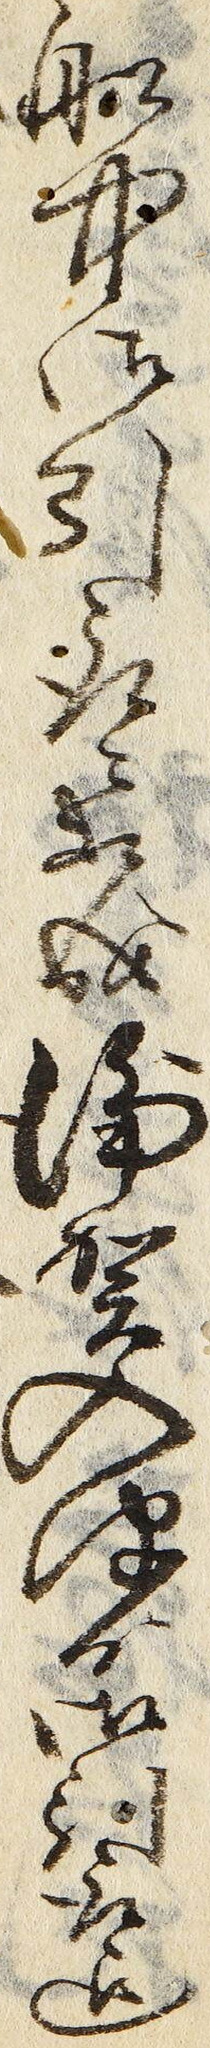船中御引取ニ相成浦賀入津ゟ御引取迄
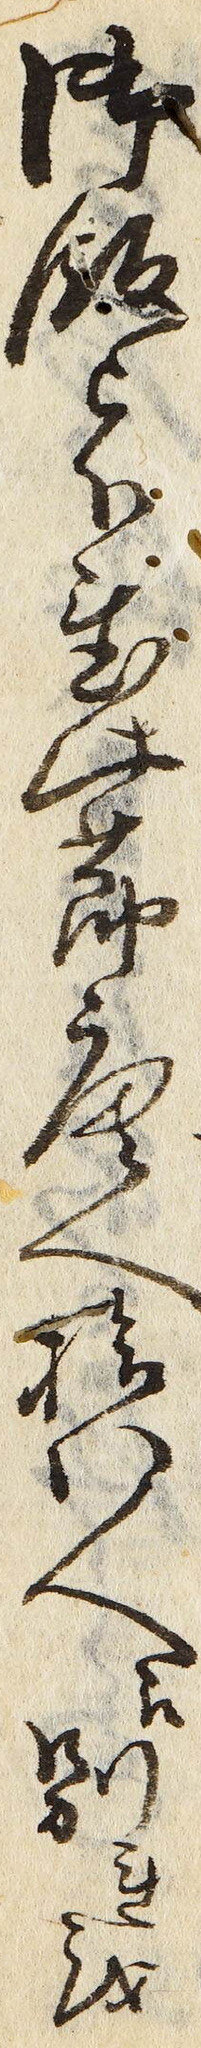御飯被下置此節唐人拾八人え別れを
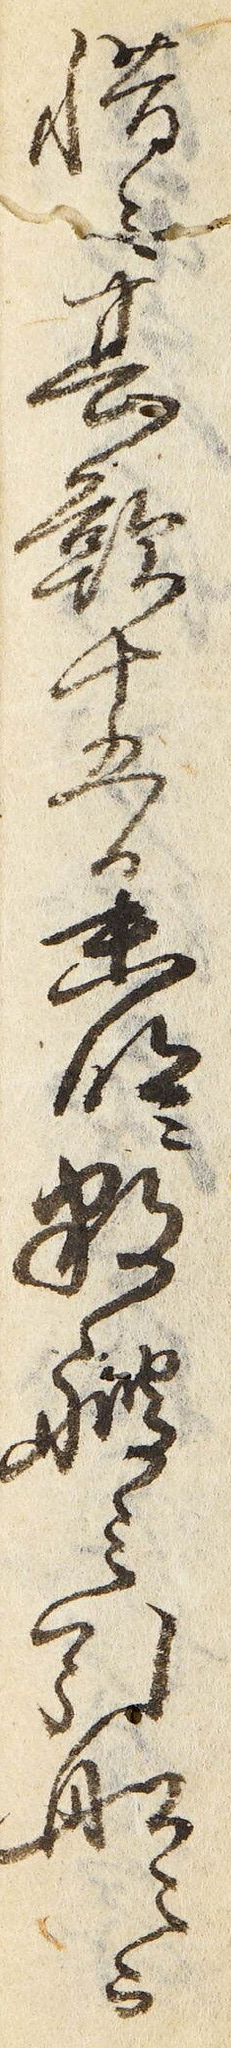惜ミ甚歎十五日未明ニ数艘之引船ニ而
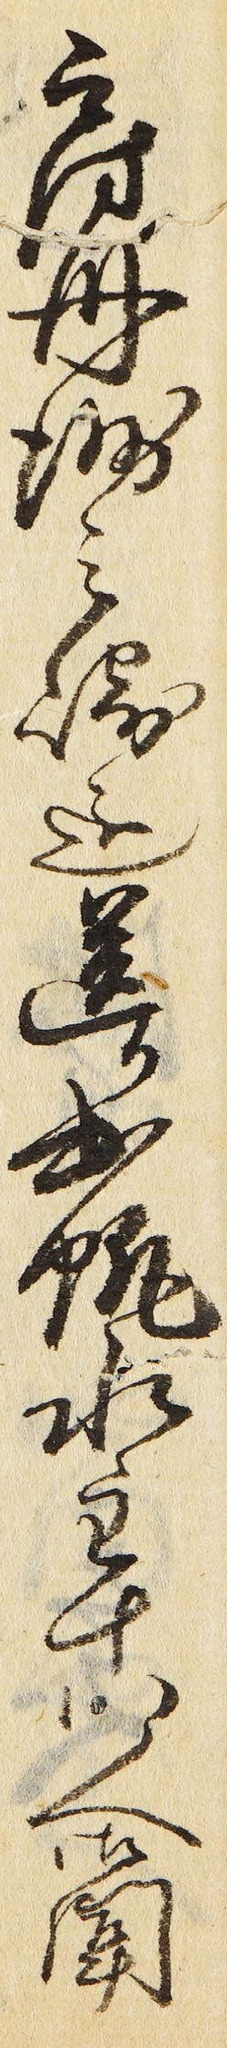房州洲之崎迄送り出帆水主十八人御聞
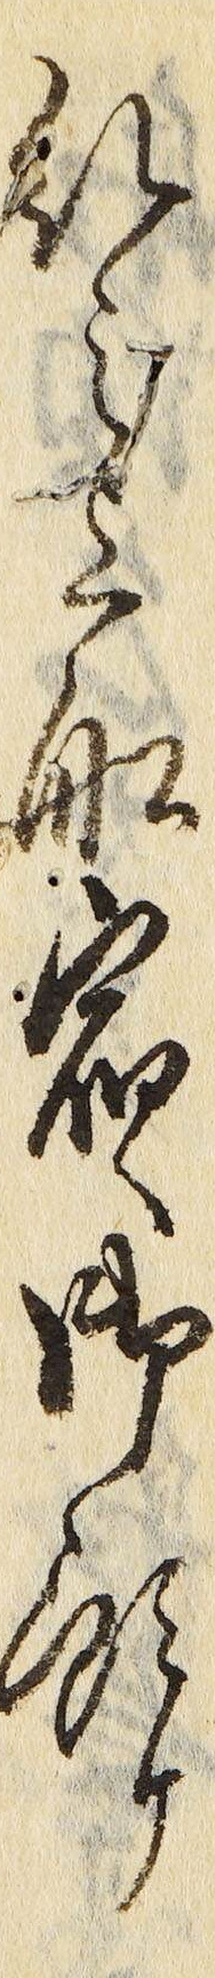糺之上船宿へ御預ケ
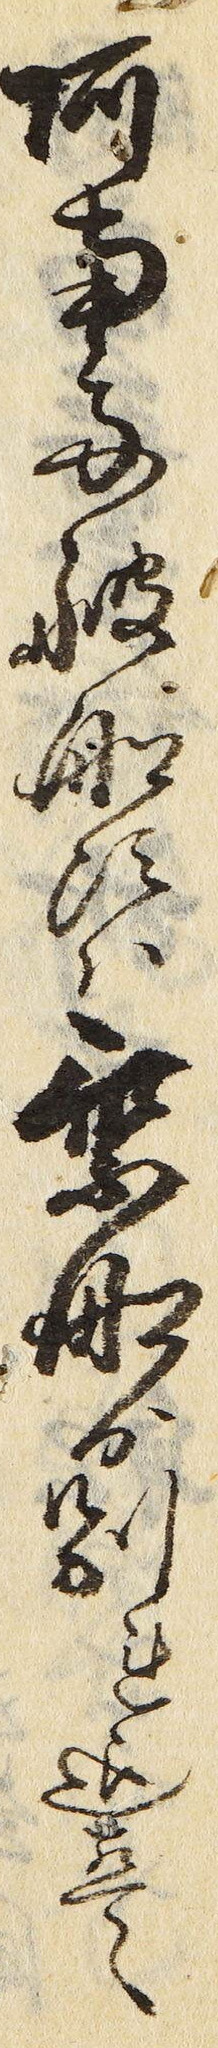阿南両艘船頭ハ乗船ゟ別れ迄は
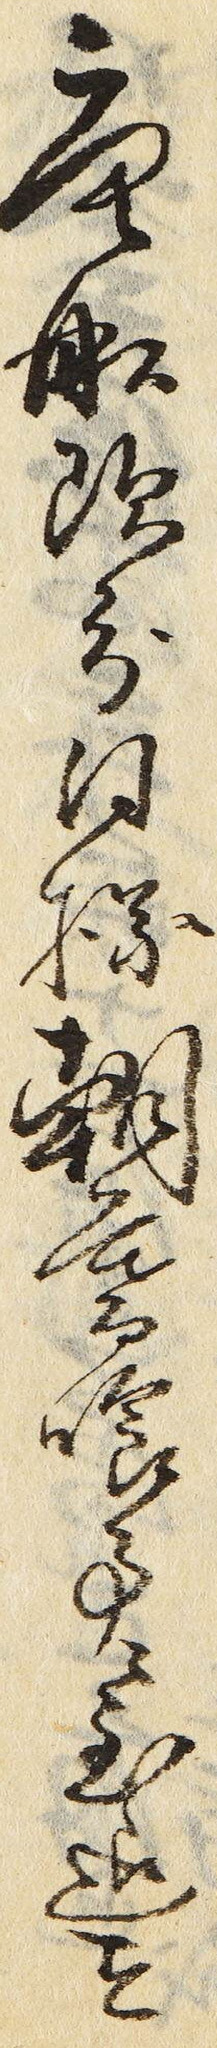唐船頭分同様朝暮食事ニ至迄こと
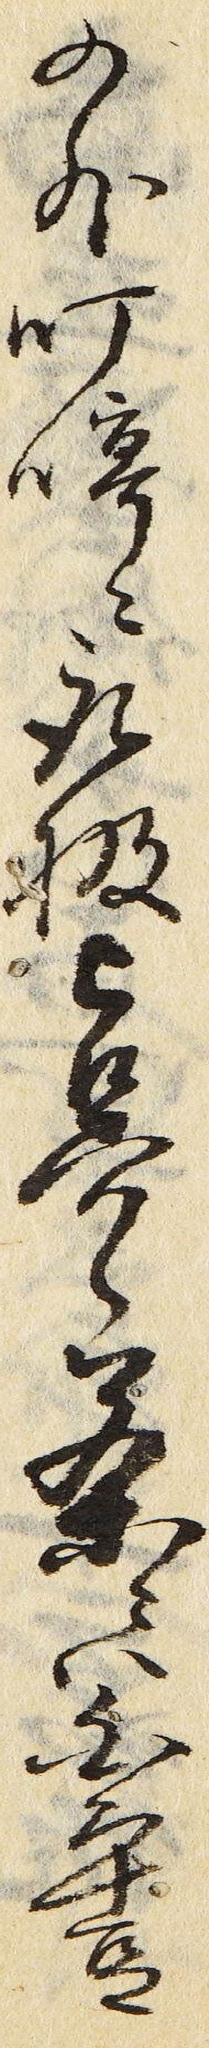の外叮嚀ニ取扱被呉候茶ニハ白平豆
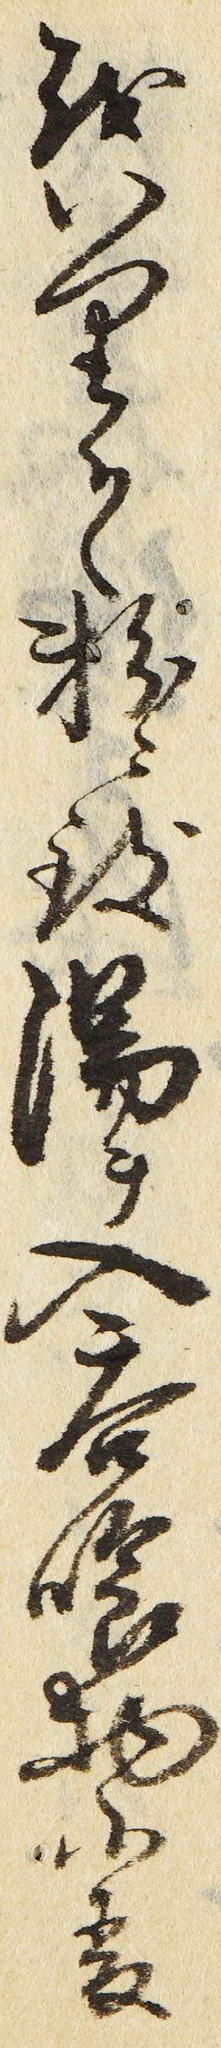をいりて粉ニ致湯ヲ入呑食物小麦
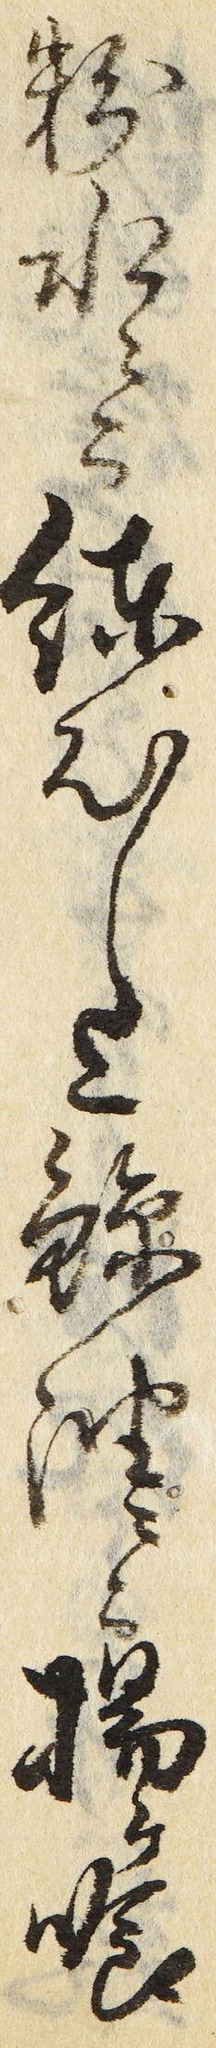粉水ニ而練むし上鯨油ニ而揚ケ食
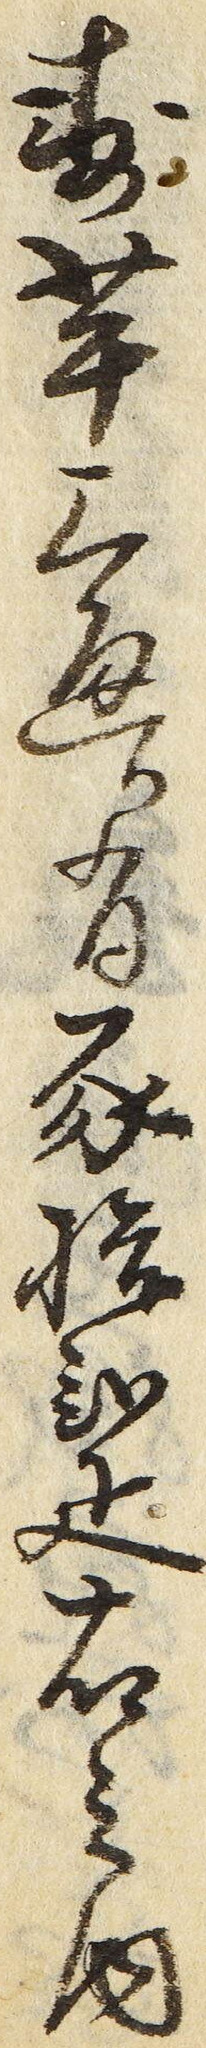す芋三通り有豕拾弐疋右之内
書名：阿波幸宝丸漂流記
